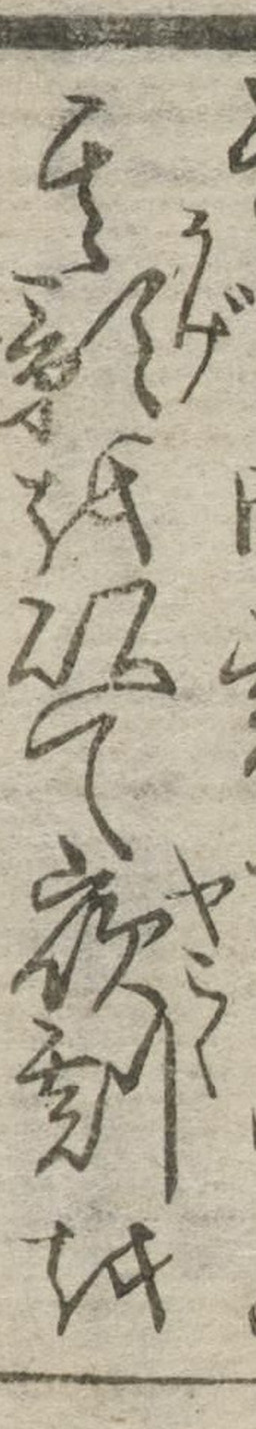其影を以て夜刻を
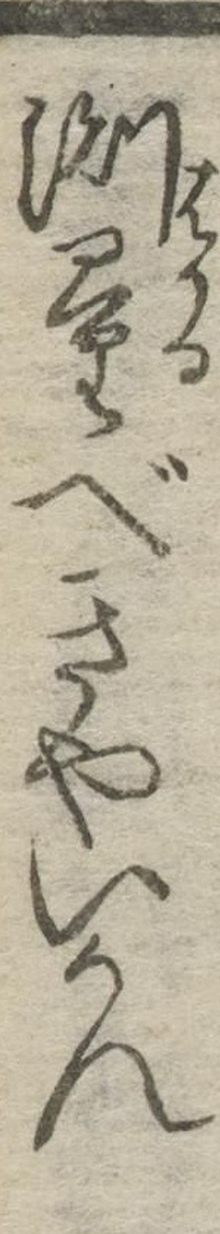測量べきやいかん

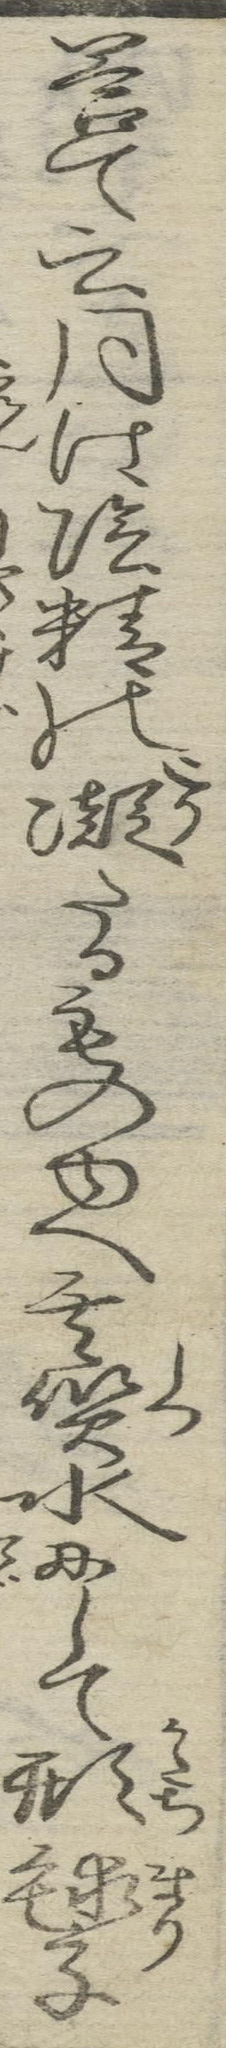答て云月は陰精の凝たるものゆへ其質水にして形毬子
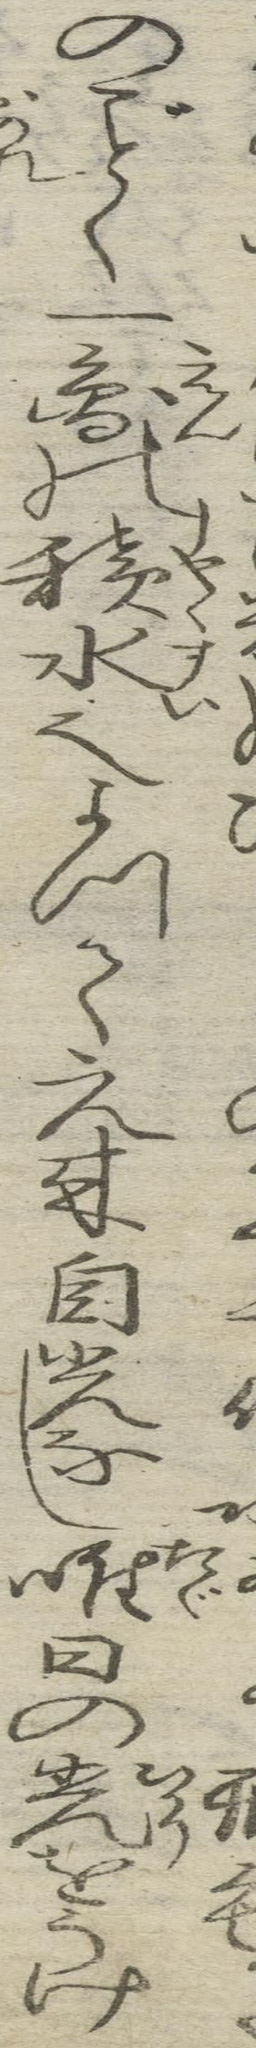のごとく一円の積水也よつて元来自光なし唯日の光をうけ
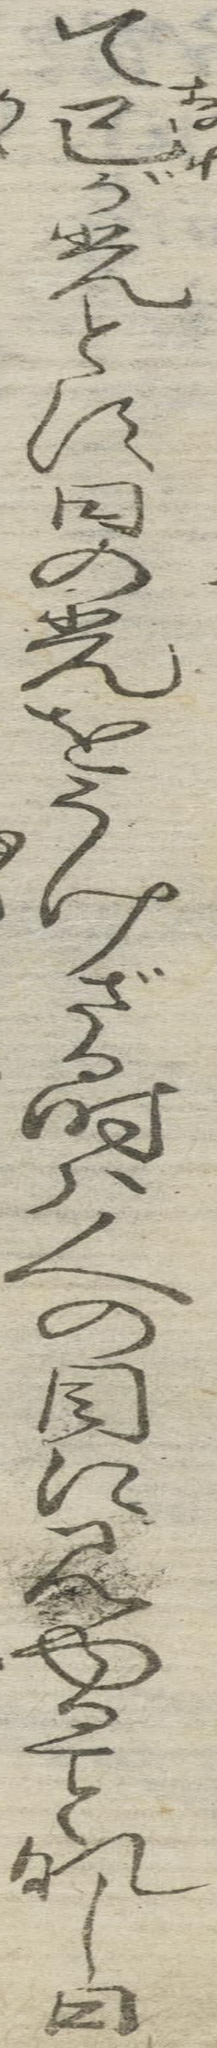て己が光とす日の光をうけざる時は人の目に見ゆることなし日
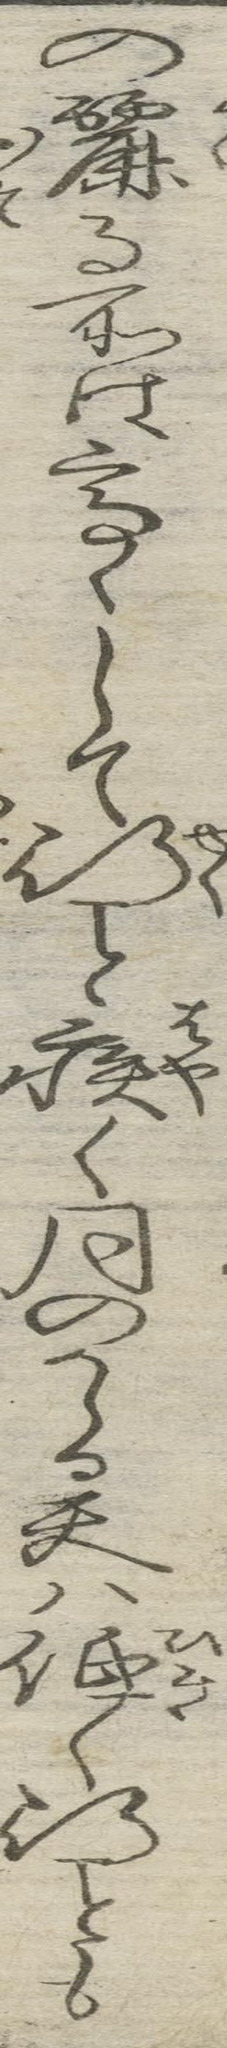の麗る所は高くして行こと疾く月のかゝる天は低く行ことも
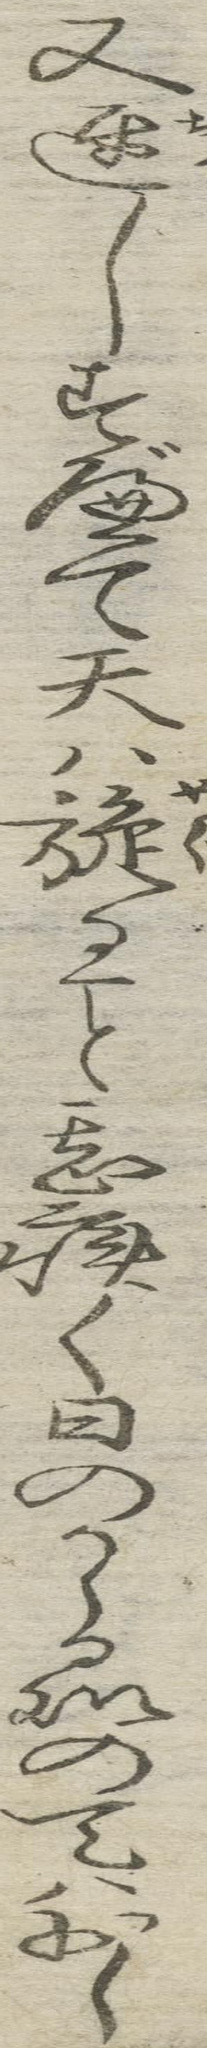又遅しすべて天は旋ること甚疾く日のかゝる所の天は少し
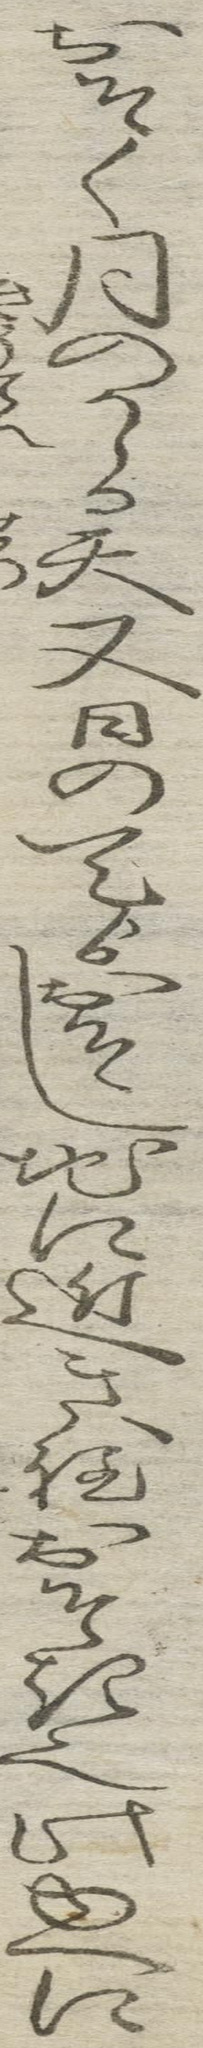おそく月のかゝる天又日の天ゟおそし地に近きは程おそき也此ゆへに
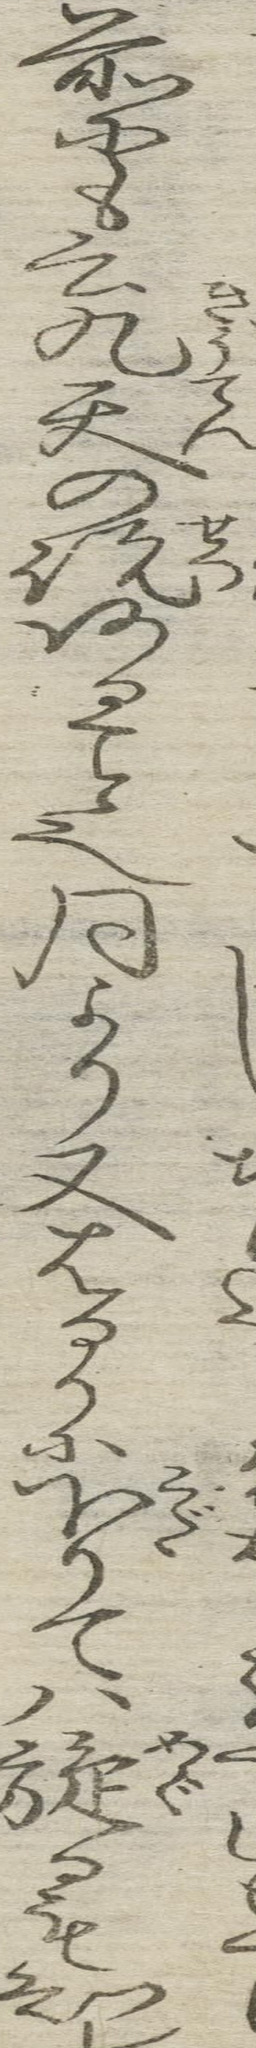前にも云九天の説あること也月より又はるかに下りては旋るも替
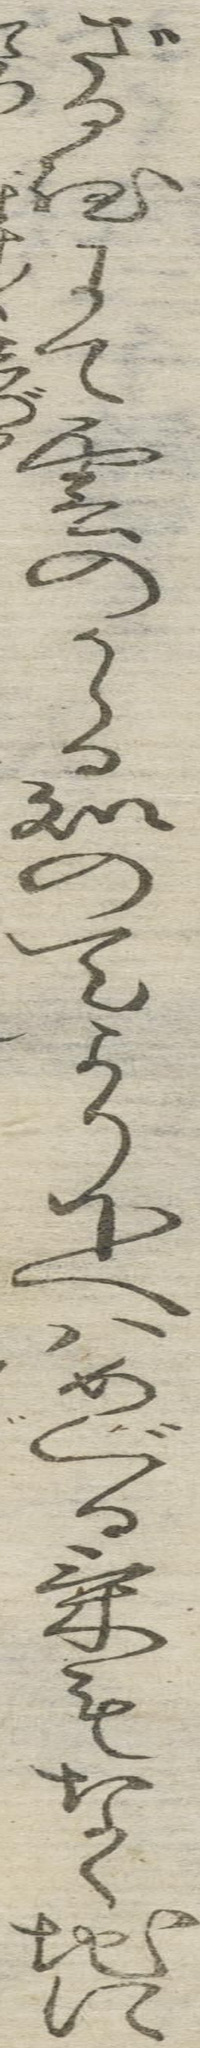ざる程にて雲のかゝる処の天より下へはめぐる気もなく地に
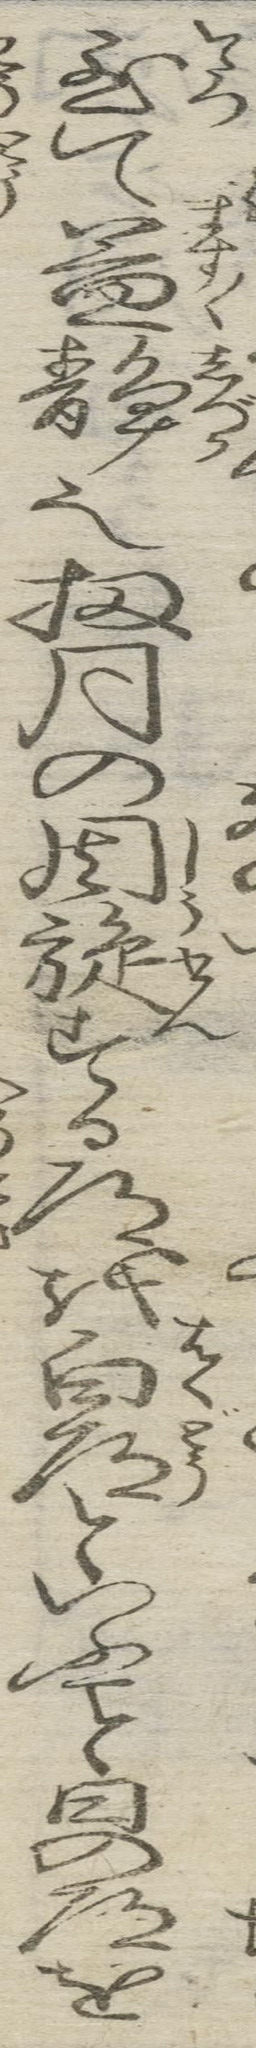至て益静也扨月の周旋する道を白道といふこと日の道を
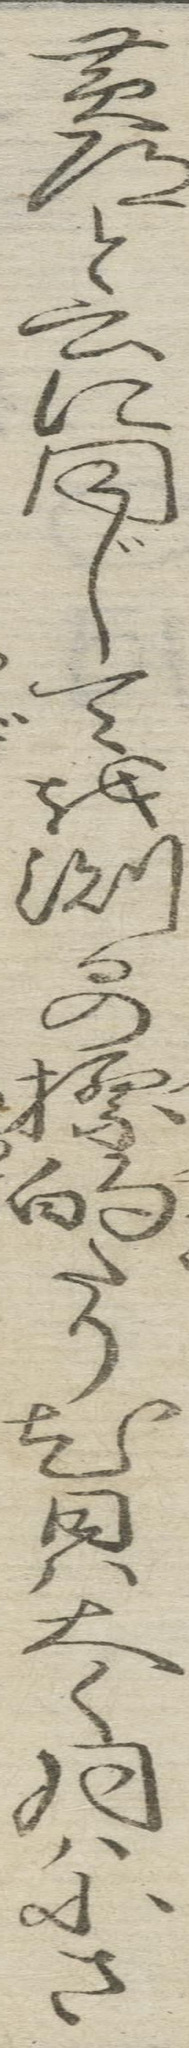黄道と云に同じ天を測るの標的たり尤日は大く月は小さ
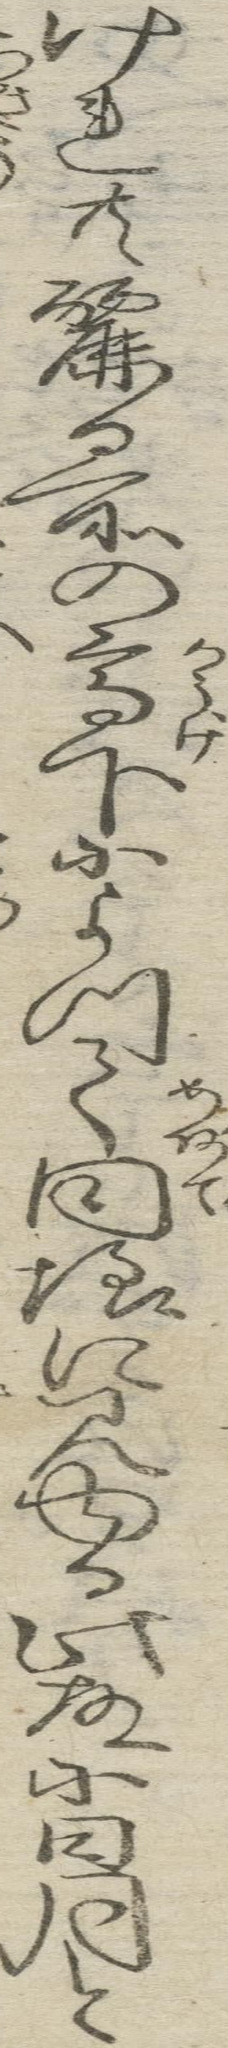けれ共麗る所の高下によつて同に見ゆる此故に日月と
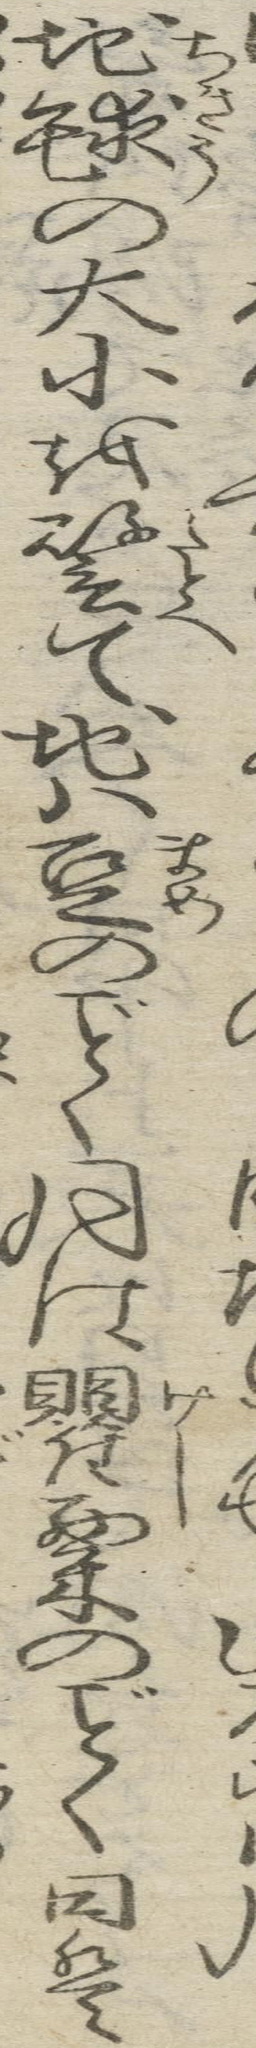地毬の大小を譬て地は豆のごとく月は罌粟のごとく日は
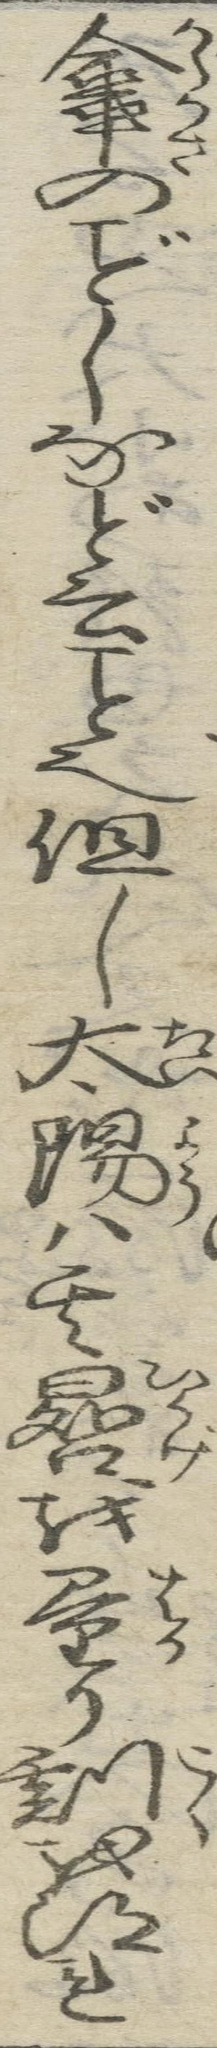傘のごとくなど云こと也但し太陽は其晷を量り刻を得れ
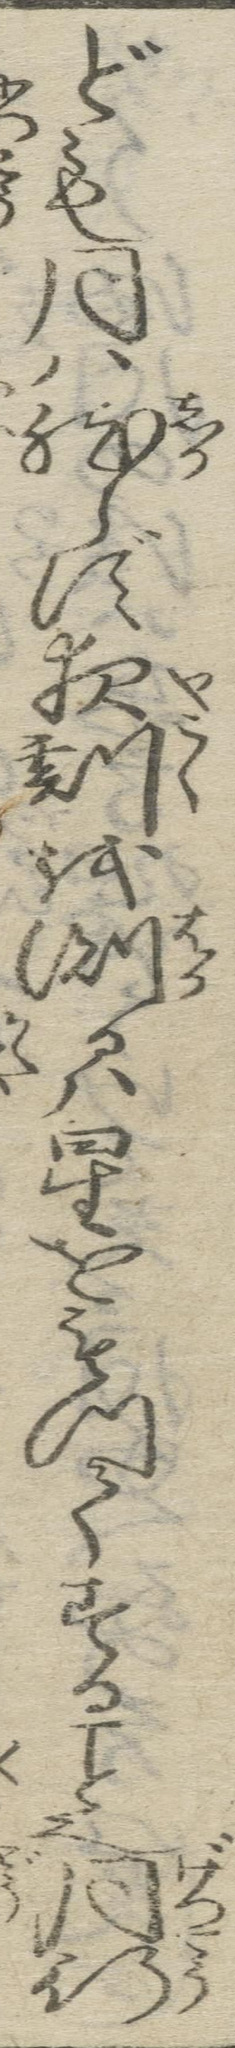ども月は然らず夜刻を測るは星をもつてすること也月行
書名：訓蒙天地辨　天
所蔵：東京大学地震研究所図書室 Earthquake Research Institute Library, The University of Tokyo, JAPAN
